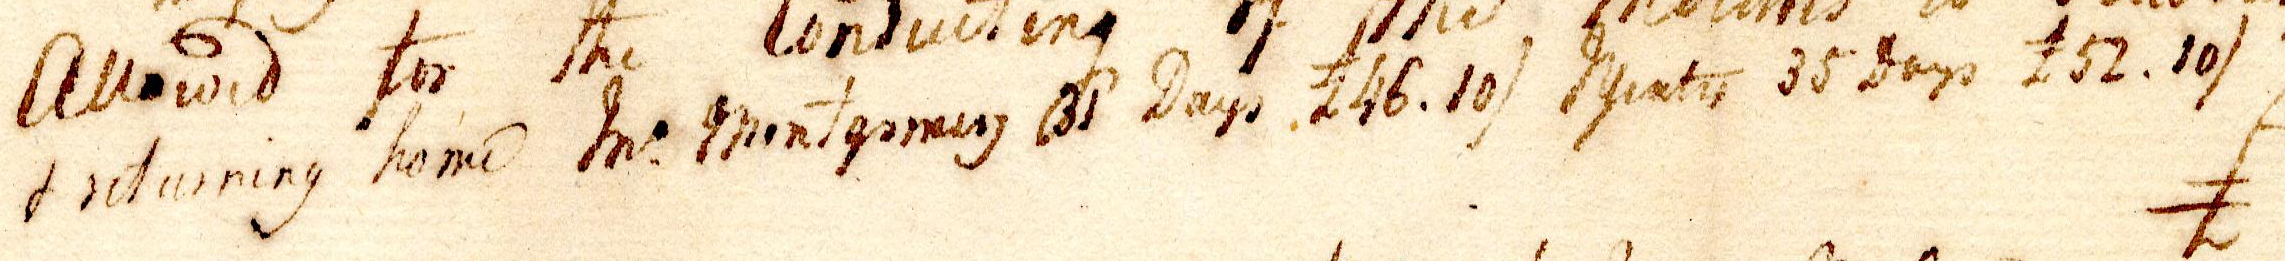& returning home Jn^o. Montomgery 31 Days. £46.10) J. Yeates 35 Days £52.10)
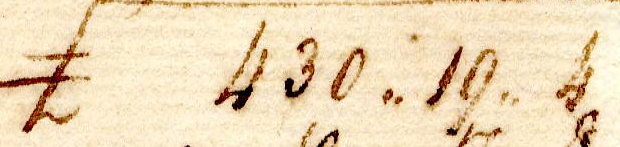£ 430. 19. 4
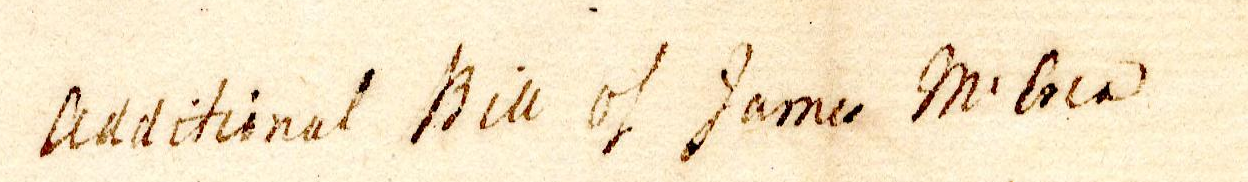Additional Bill of James M^cCrea 10. 17. 8
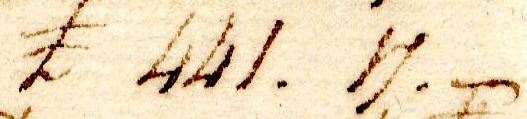£441. 17.-
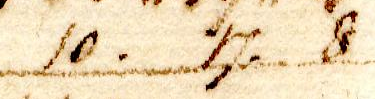10. 17 8
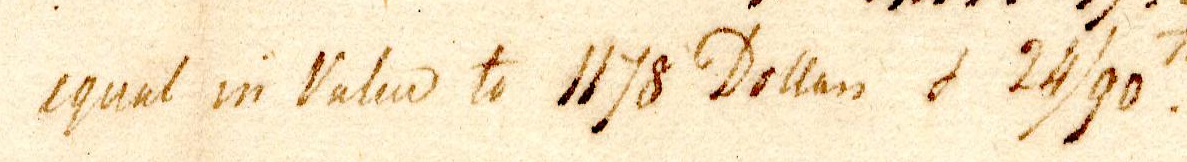equal in Value to 1178 Dollars & 24/90
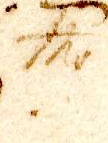The
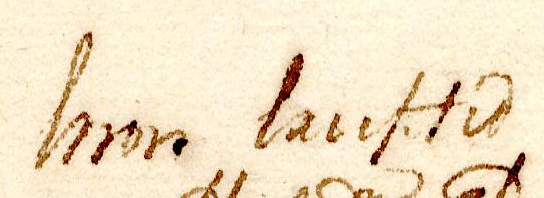Error Excepted
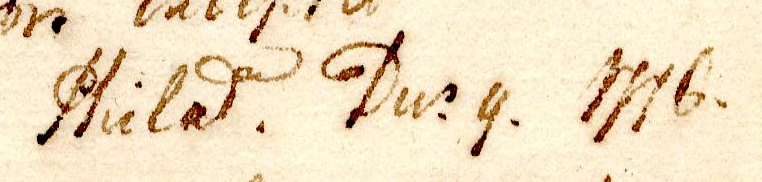Philad^a. Dec^r. 9. 1776.
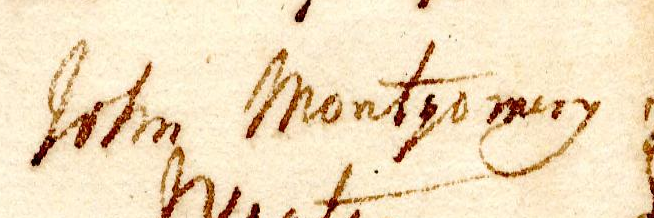John Montgomery
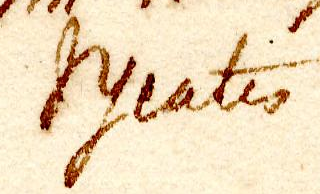J. Yeates
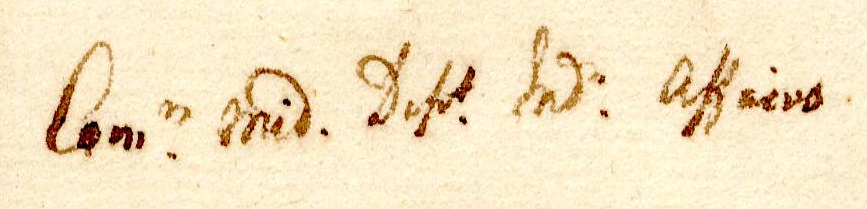Com^n. Mid. Dept. Ind^n: Affairs
